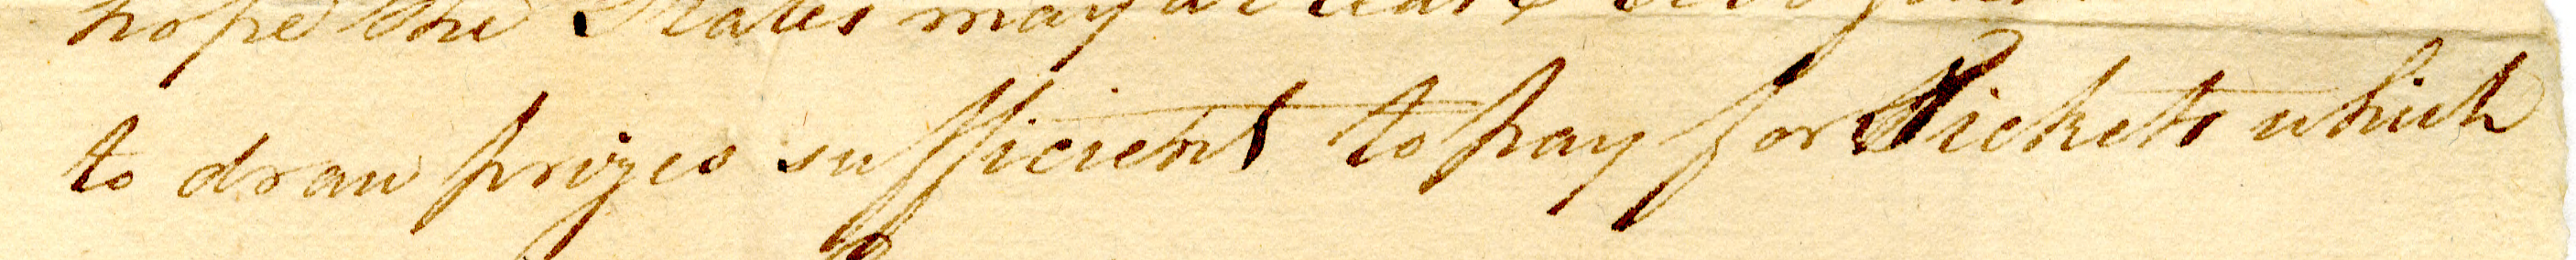to draw prizes sufficient to pay for Tickets which
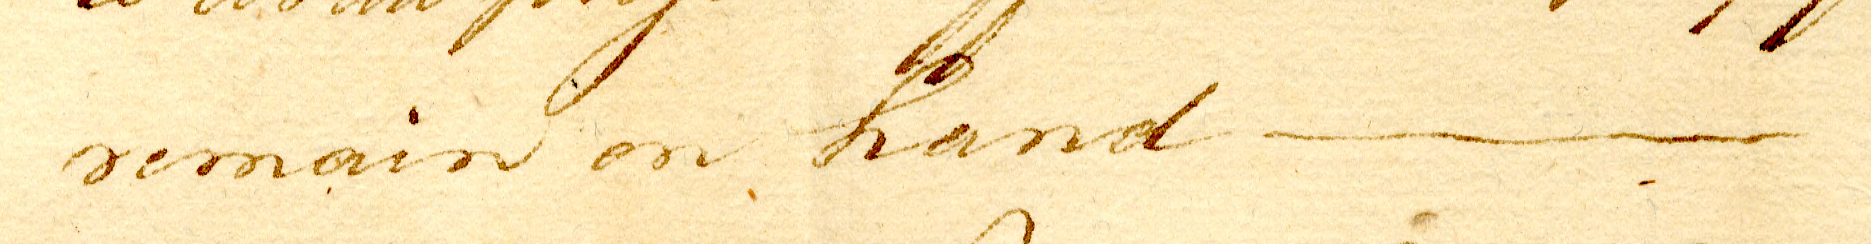remain on hand-
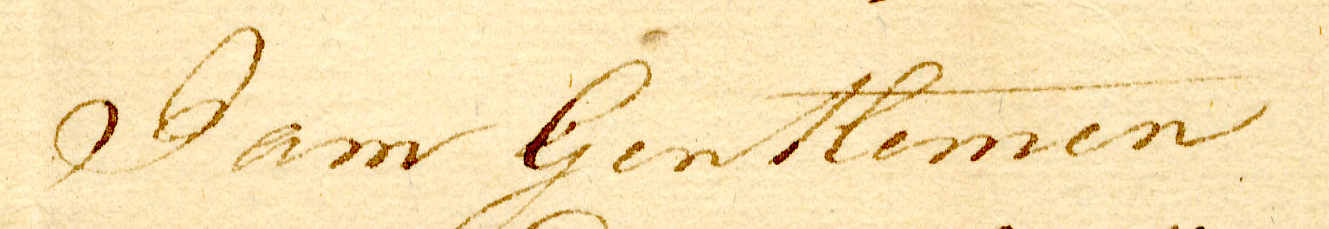I am Gentlemen
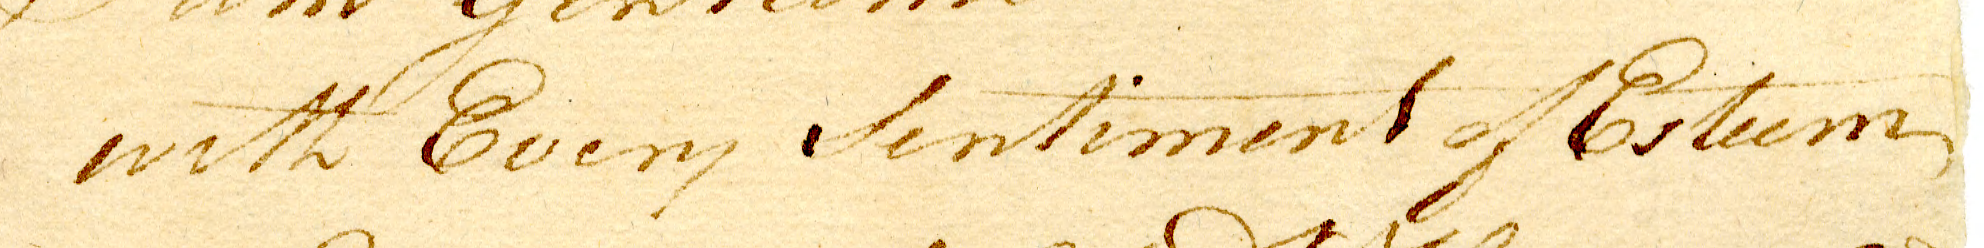with Every Sentiment of Esteem
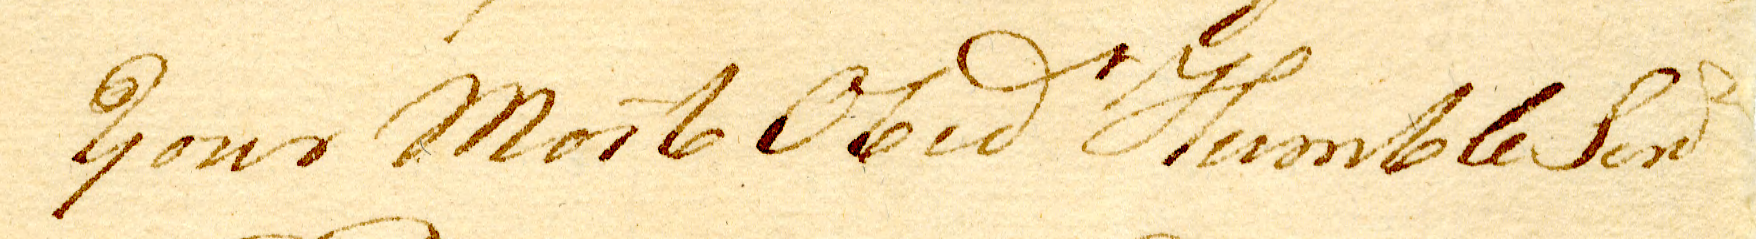Your most Obed^t Humble Serv^t
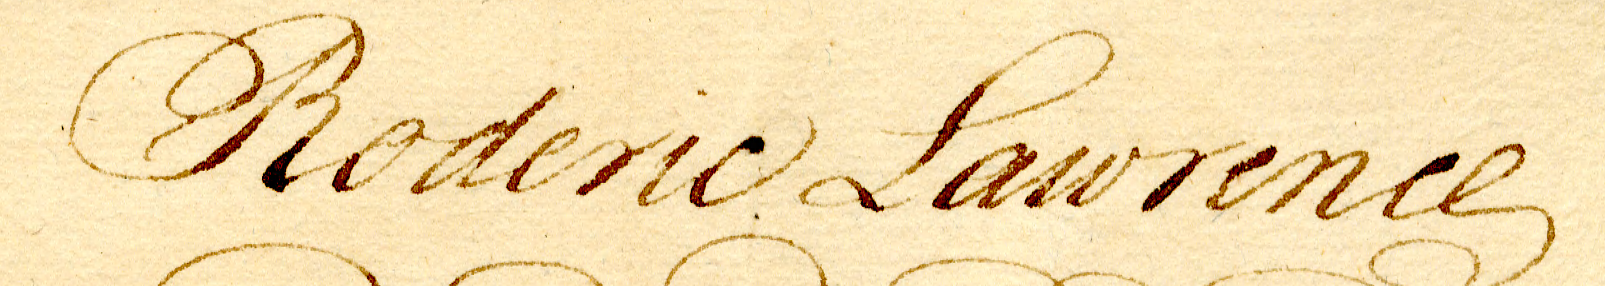Roderic Lawrence
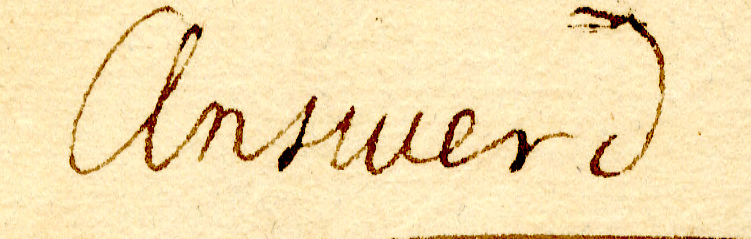Answerd
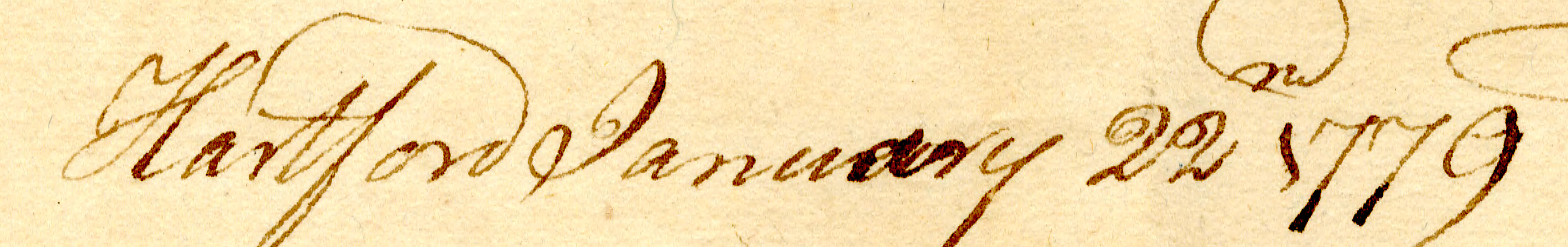Hartford January 22^nd 1779
